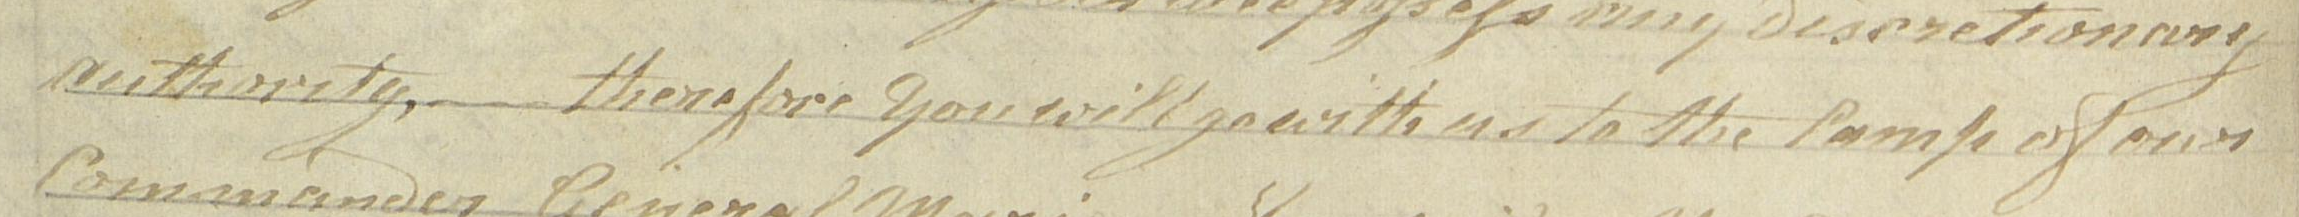authority, therefore You will go with us to the Camp of our
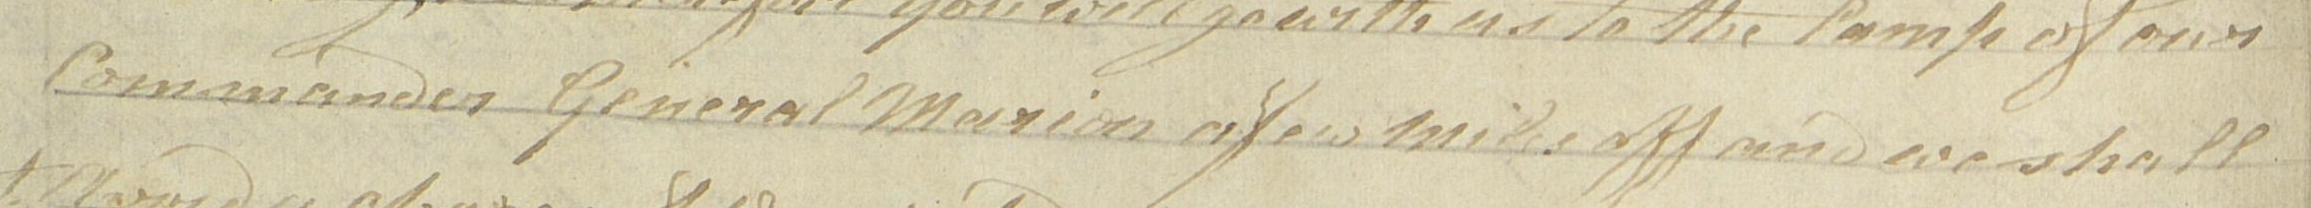Commander General Marion a few Miles off and we shall
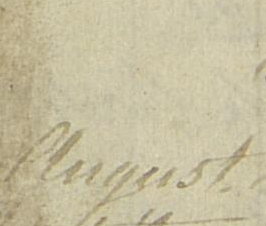August
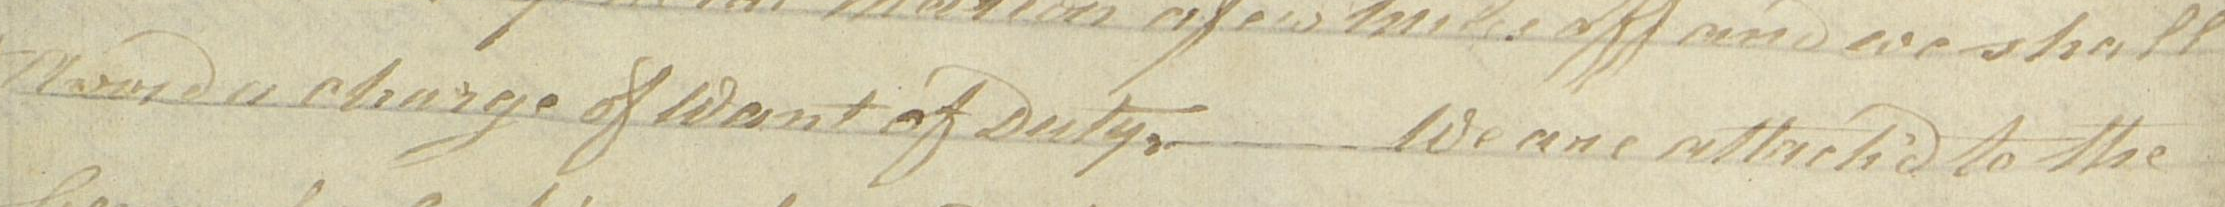word a charge of want of Duty, We are attach'd to the
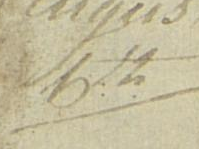6^th
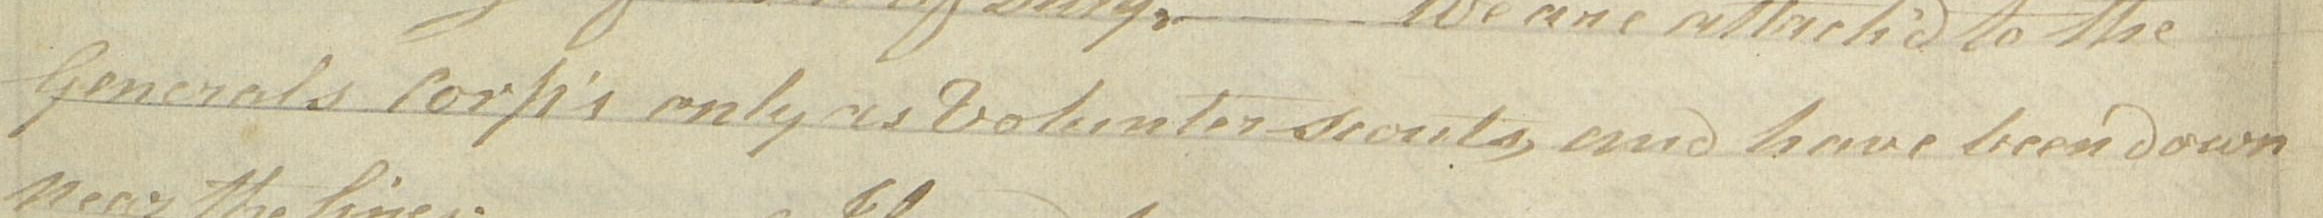Generals Corp's only as Volunter scouts, and have been down
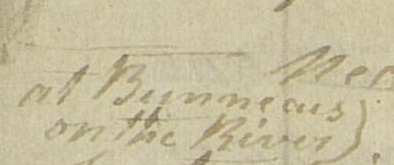at Bunneaus
